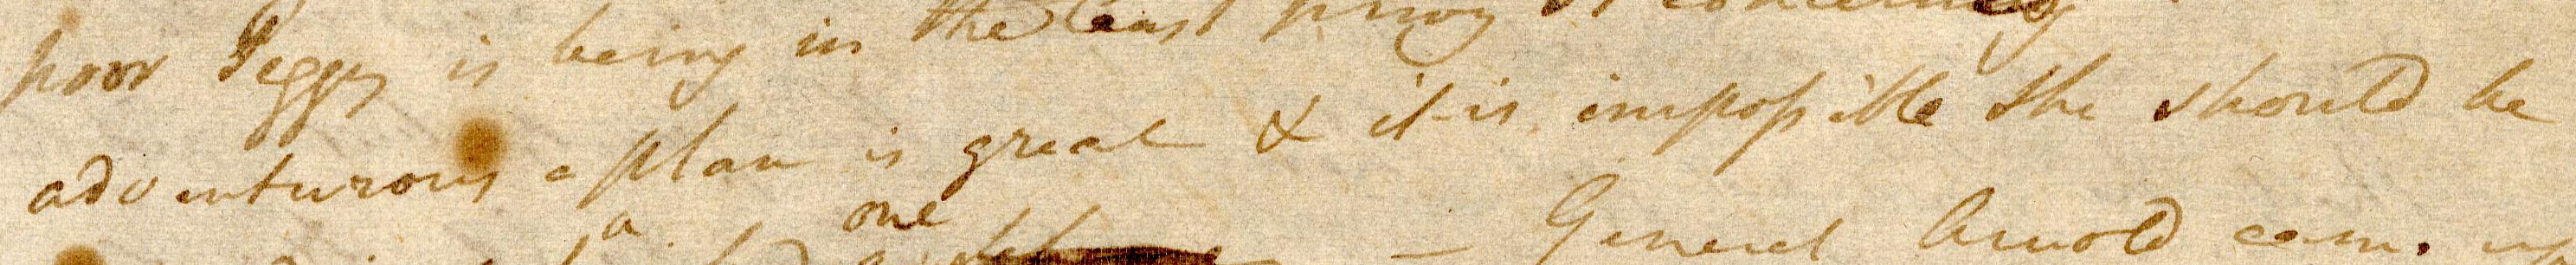adventurous a Man is great & it is impossible she should be
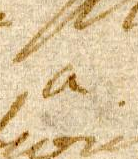a
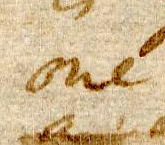one
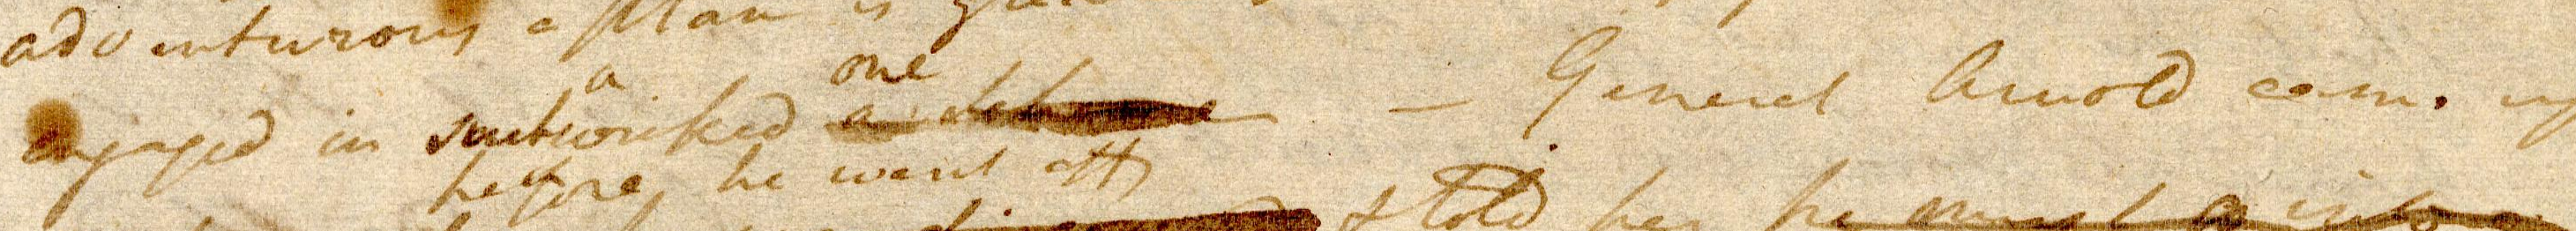engaged in such ^ wicked ^ a [____]. General Arnold came up
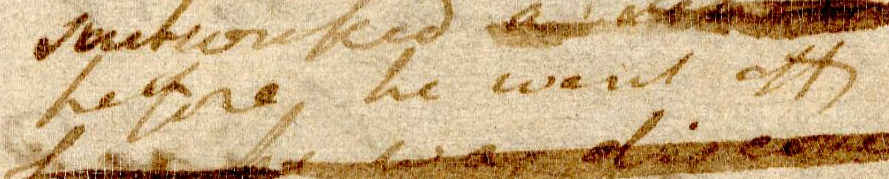before he went off
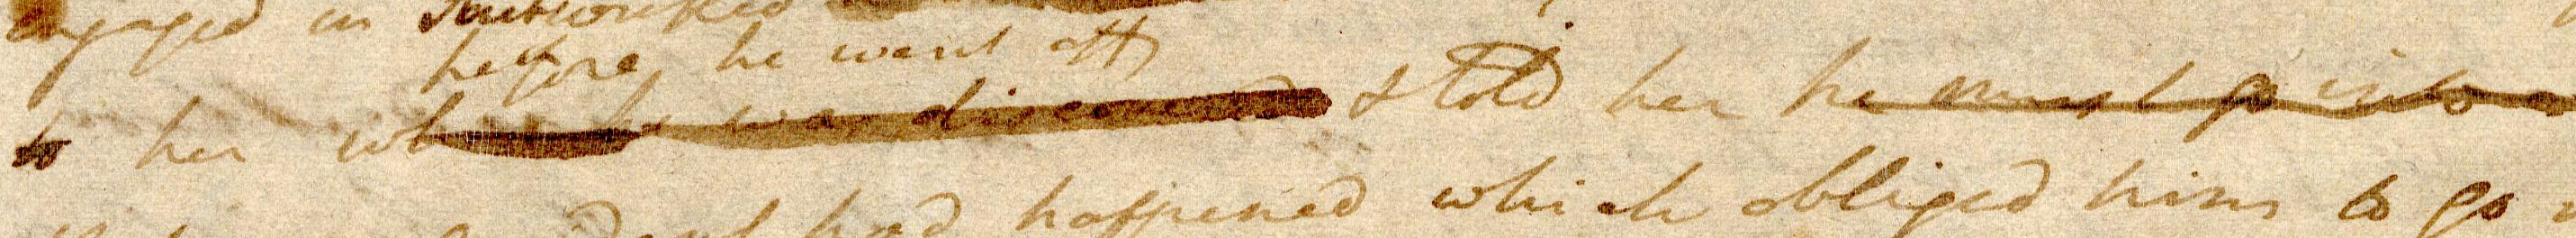to her [which was discovered] & told her [he must go into]
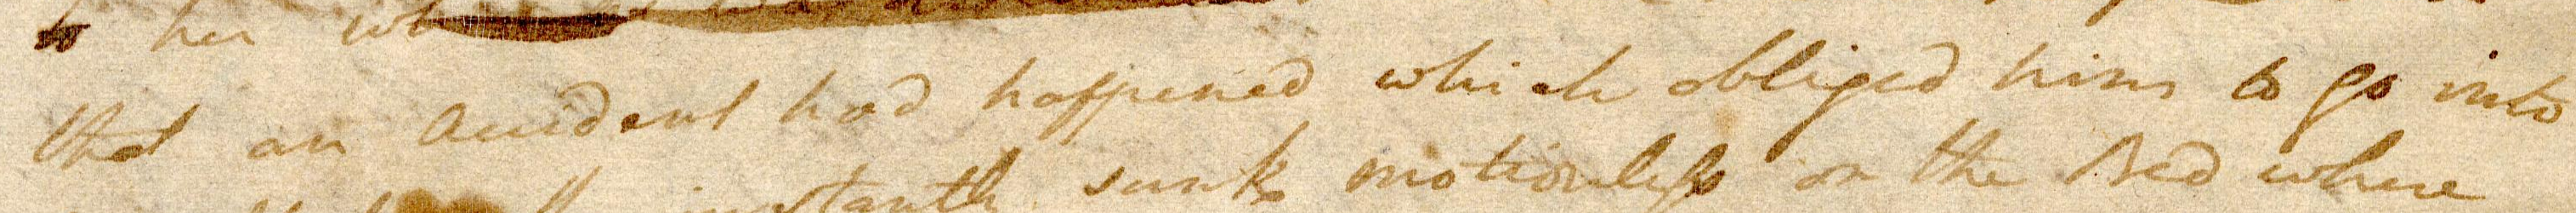that an accident had happened which obliged him to go into
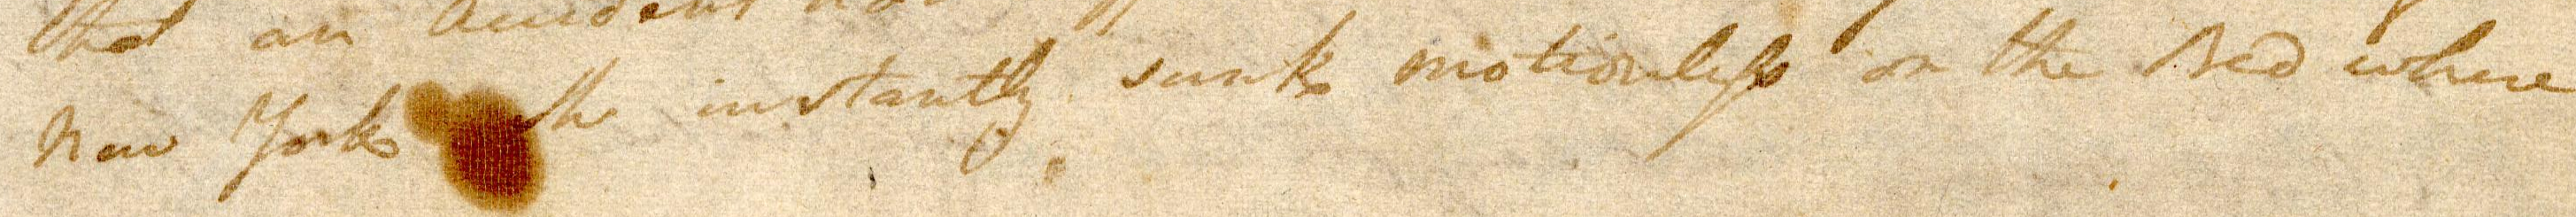New York she instantly into herself on the Bed where
